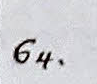64.
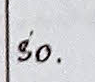30.
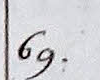69.
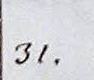31.
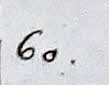60.
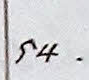54
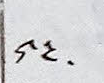52.
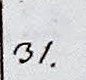31.
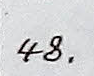48
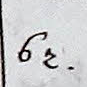62
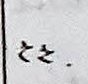22
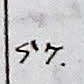57
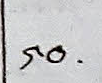50
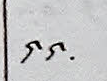55.
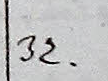32.
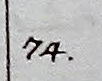74.
